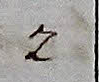2
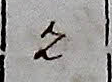2
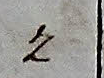2
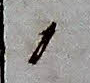1
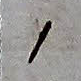1
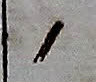1
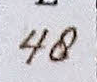48
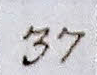37
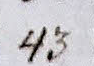43
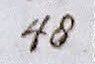48
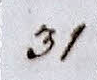31
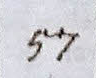57
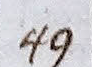49
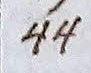44
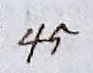45
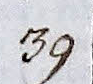39
